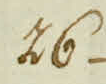26
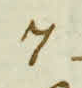7
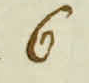6
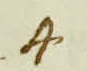4
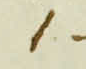1
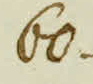60
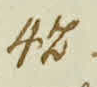42
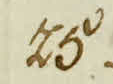25
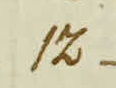12
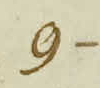9
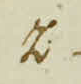2
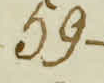59
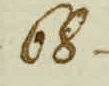68
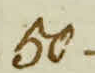50
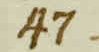47
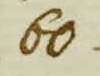60
